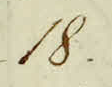18
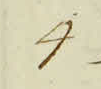4
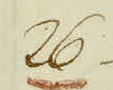26
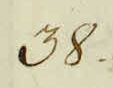38
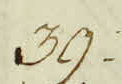39
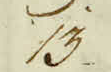13
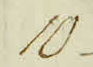10
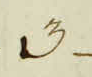3
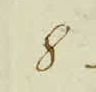8
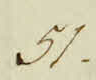51
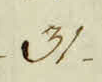31
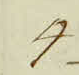4
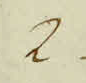2
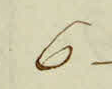6
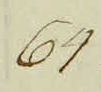64
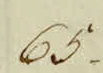65
